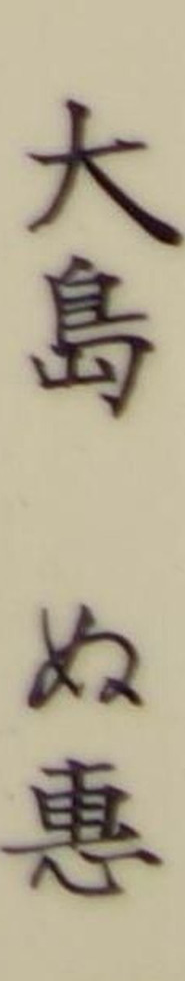大島ぬえ
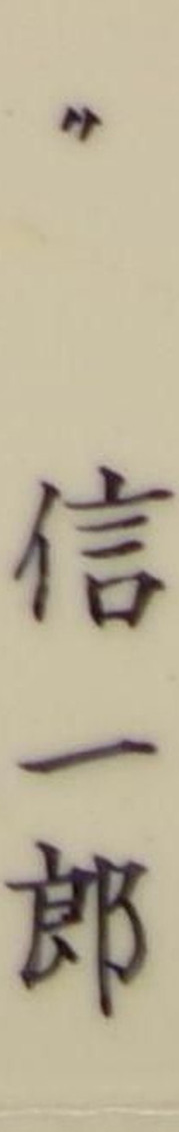信一郎
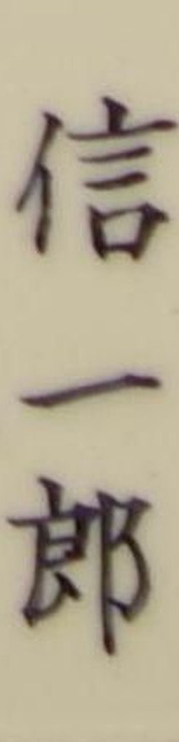信一郎
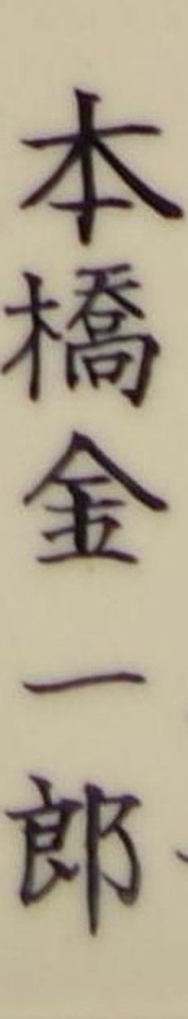本橋金一郎
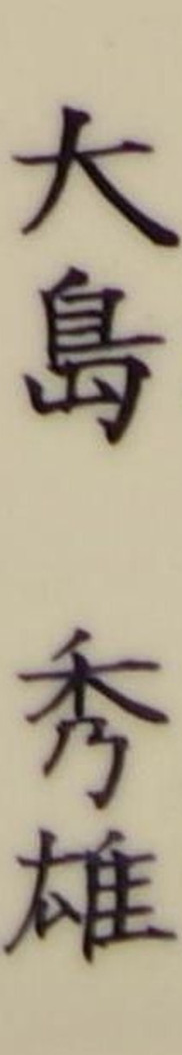大島秀雄
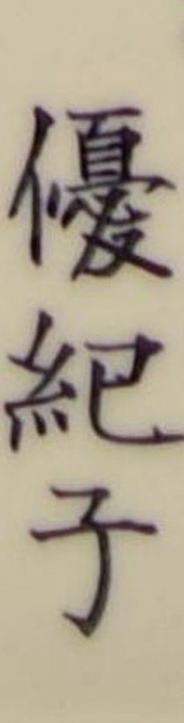優紀子
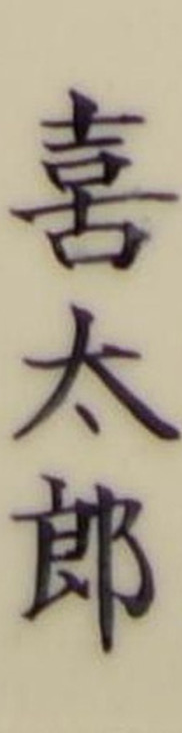喜太郎
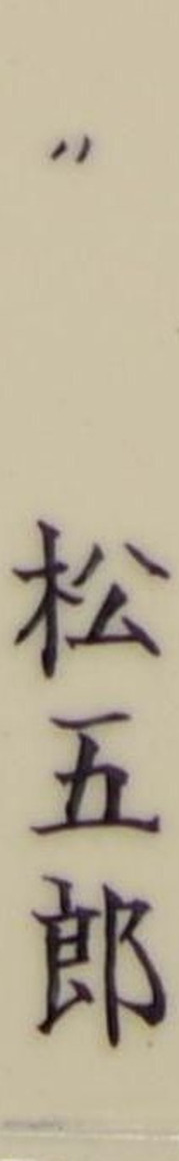松五郎
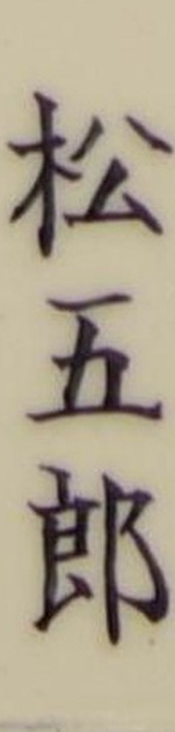松五郎
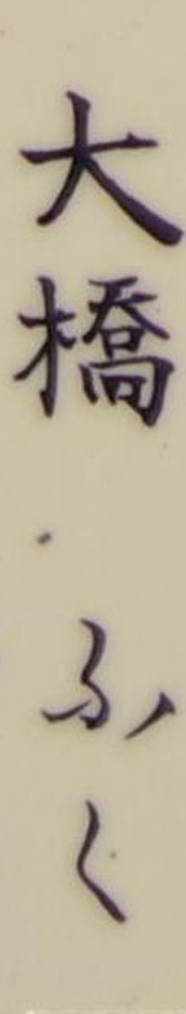大橋ふく
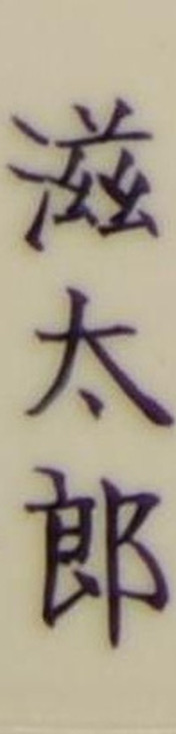滋太郎
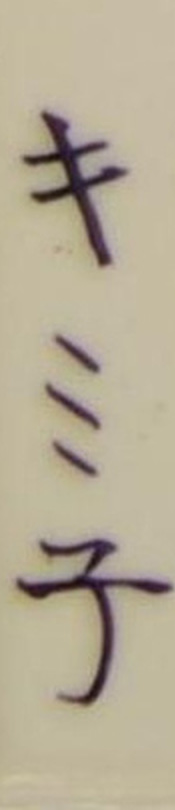キミ子

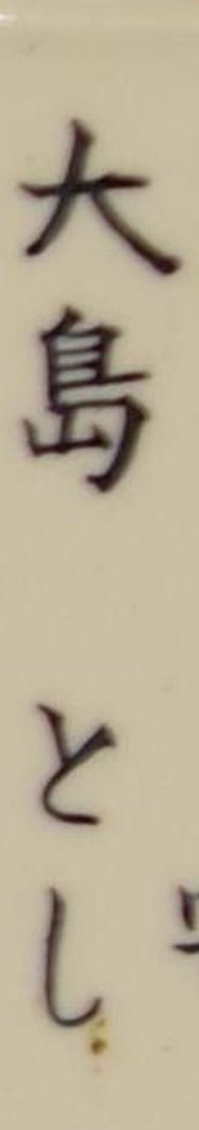大島とし
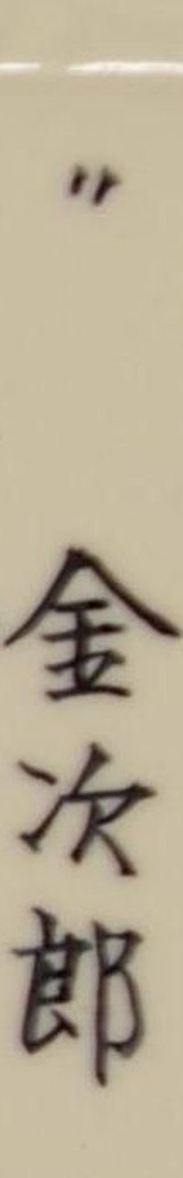金次郎
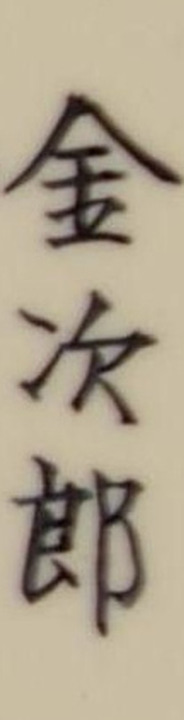金次郎
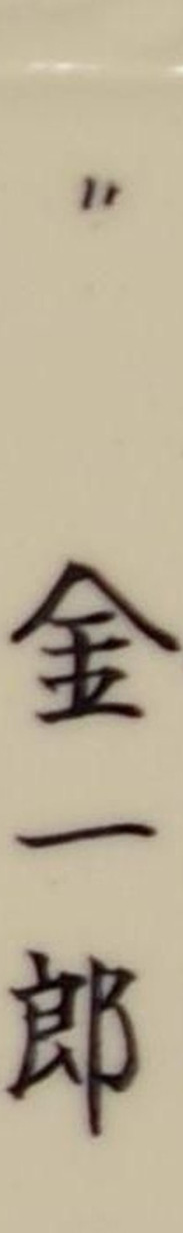金一郎
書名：E~L
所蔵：高野山金剛峯寺
